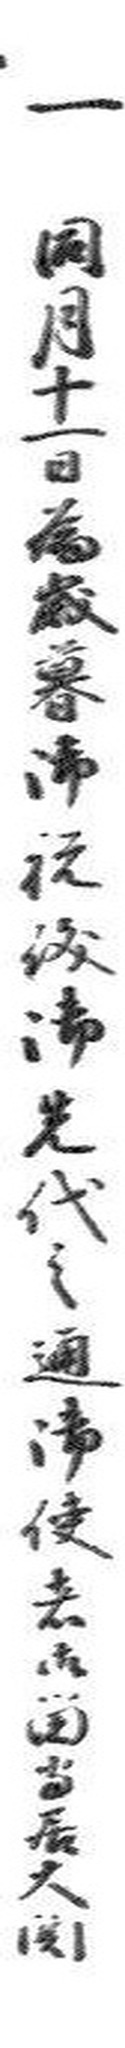一同月十一日為歳暮御祝儀御先代之通御使者御留守居大関
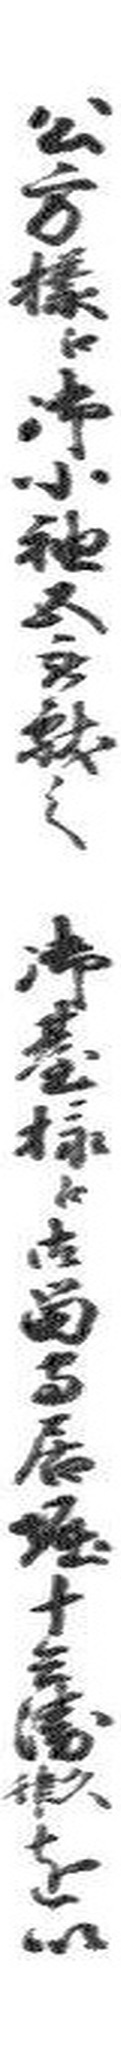公方様江御小袖五被献之御台様江御留守居堀十兵衛久律を以
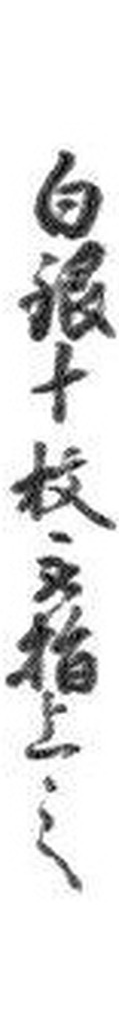白銀十枚被指上之
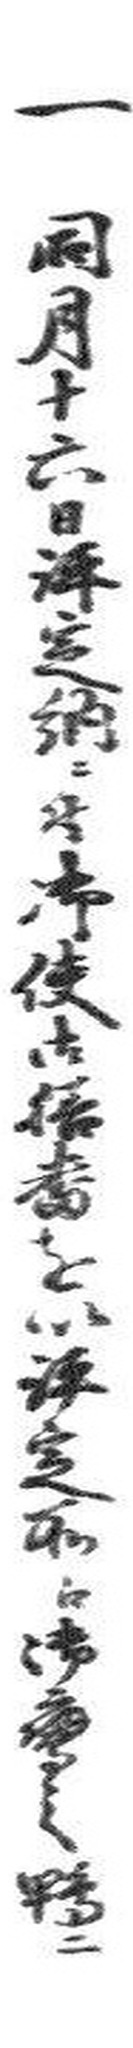一同月十六日評定納ニ付御使御膳番を以評定所江御鷹之鴨二
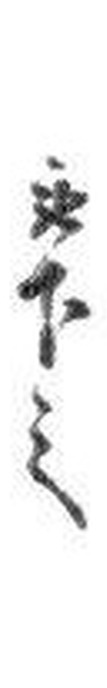被下之
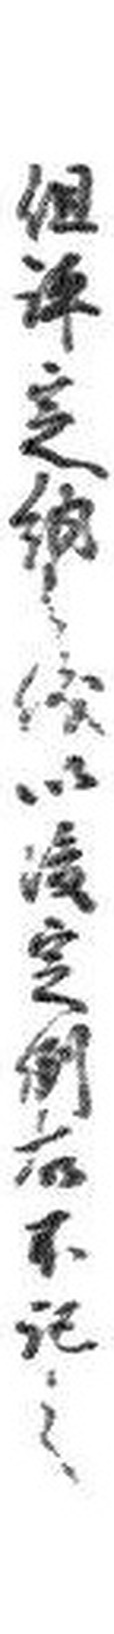但評定納之儀以後定例故不記之
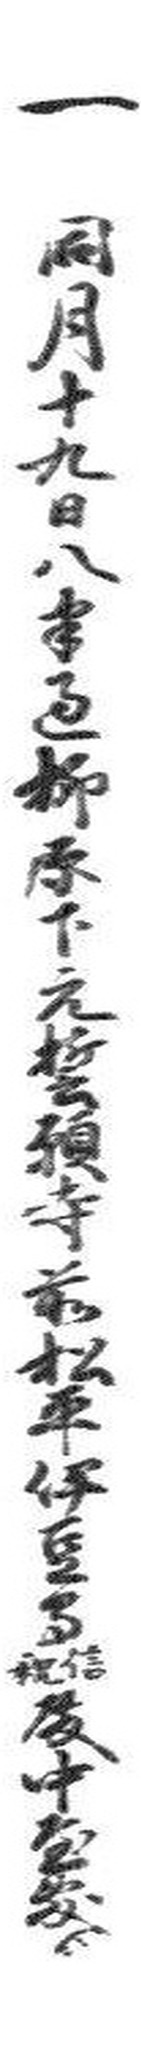一同月十九日八半過柳原下元誓願寺前松平伊豆守信祝殿中屋敷ゟ
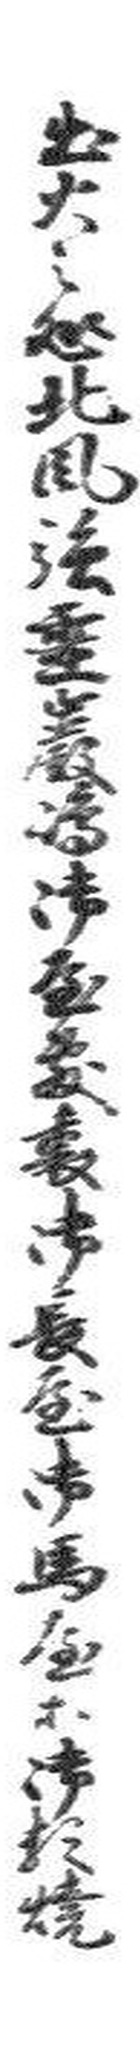出火之処北風強霊巌島御屋敷裏御長屋御馬屋等御類焼
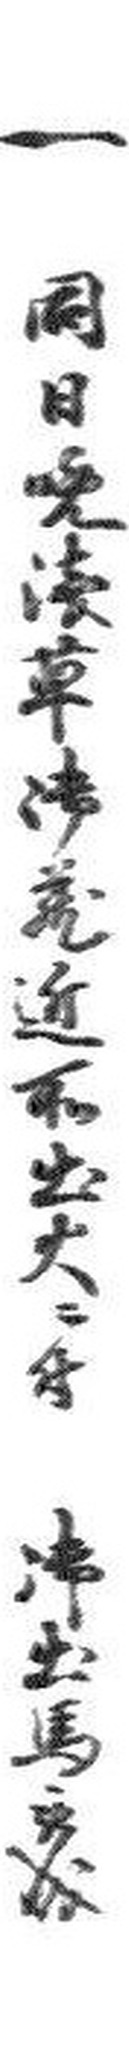一同日晩浅草御蔵近所出火ニ付御出馬被成

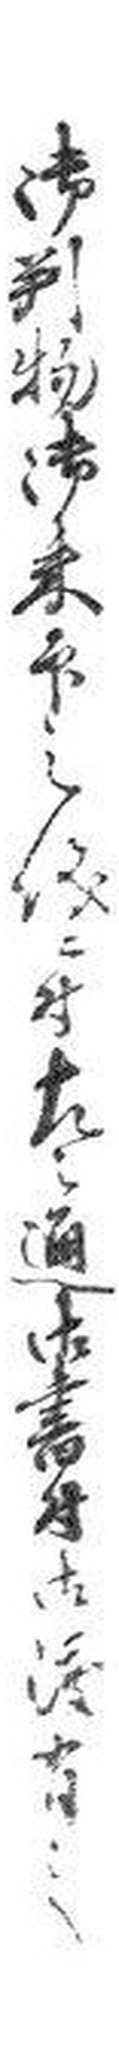御判物御朱印之儀ニ付左之通御書付御渡有之
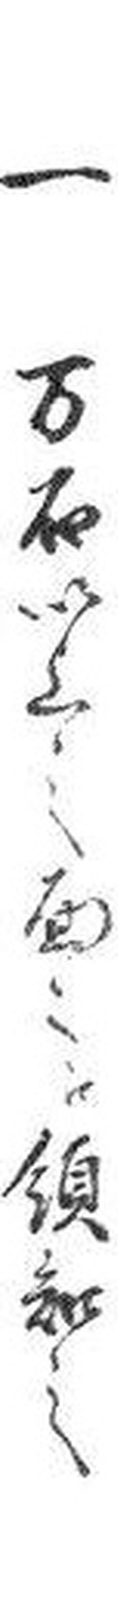一万石以上之面々江領知之
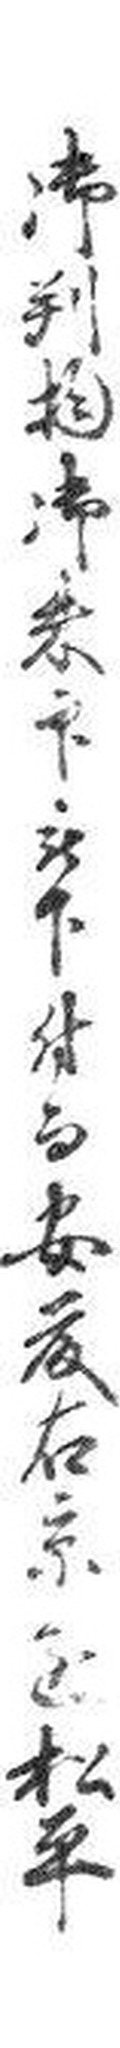御判物御朱印被下付而安藤右京進松平
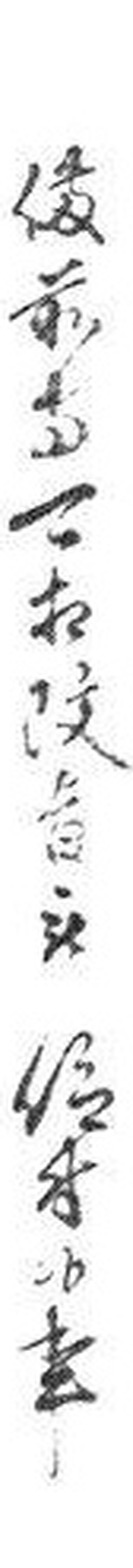備前守可相改旨被仰付候事
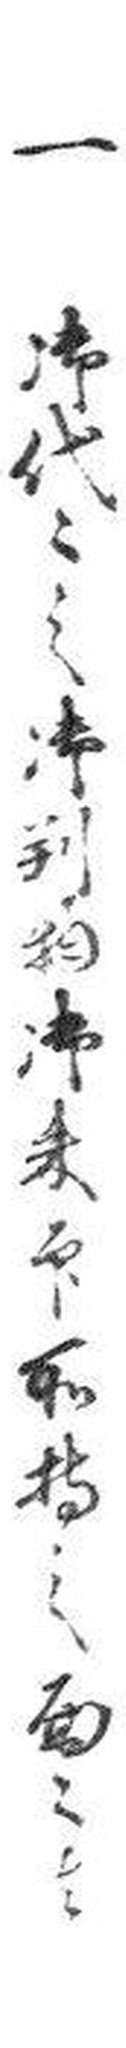一御代々之御判物御朱印所持之面々者
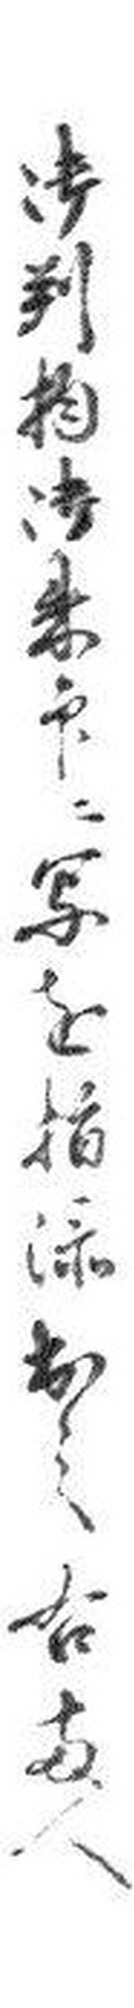御判物御朱印ニ写を指添出之右両人
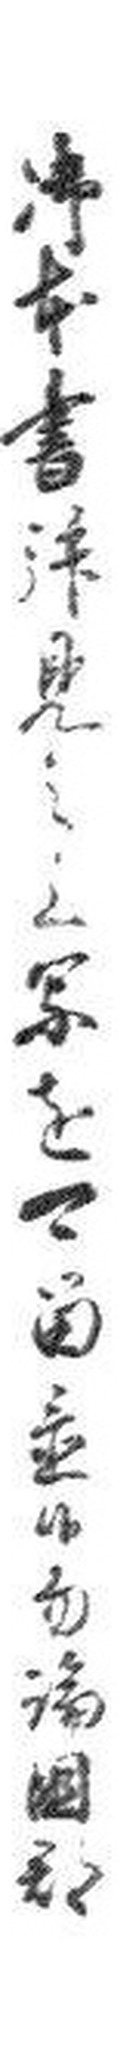御本書拝見之上写を可留置候勿論国郡
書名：家譜 二十八 吉邦公 従宝永七年七月五日到正徳元年十二月
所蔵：福井県文書館 Fukui Prefectural Archives
